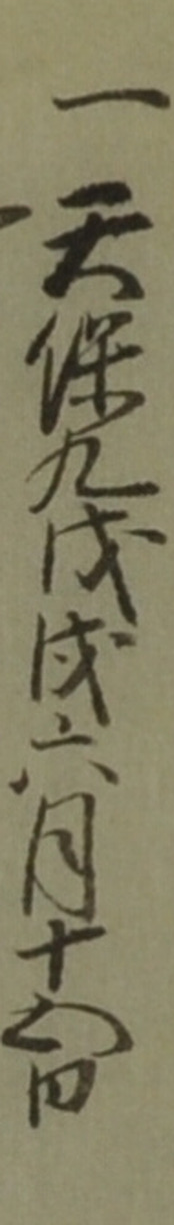一天保九戊戌六月十五日
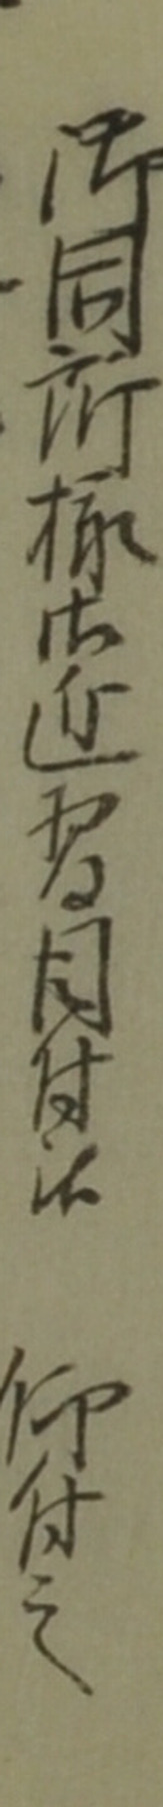御同所様御近習目付被仰付之
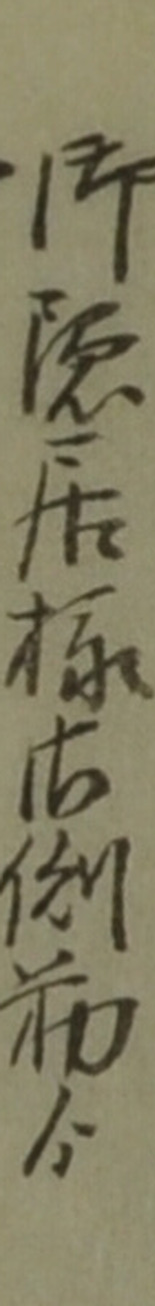御隠居様御側勤ゟ
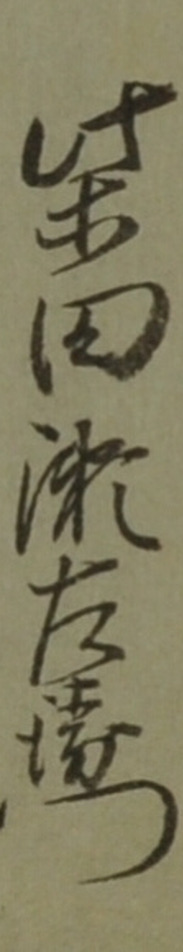柴田瀬左衛門
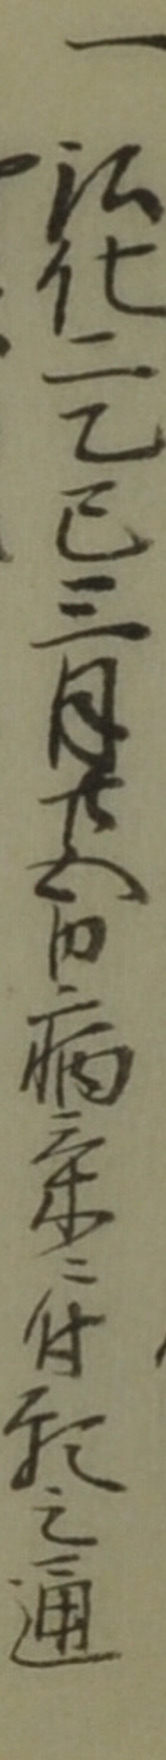一弘化二乙巳三月廿五日病気ニ付願之通
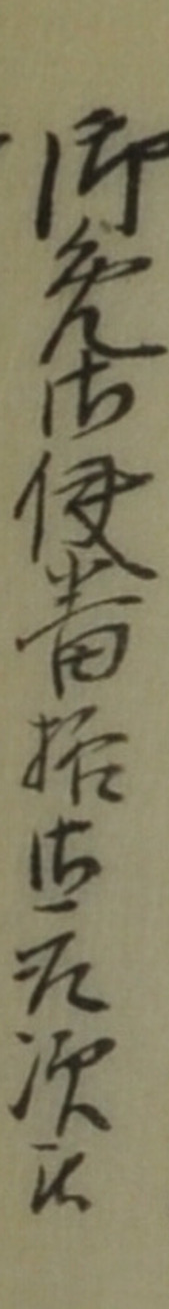御免御使番格御取次被
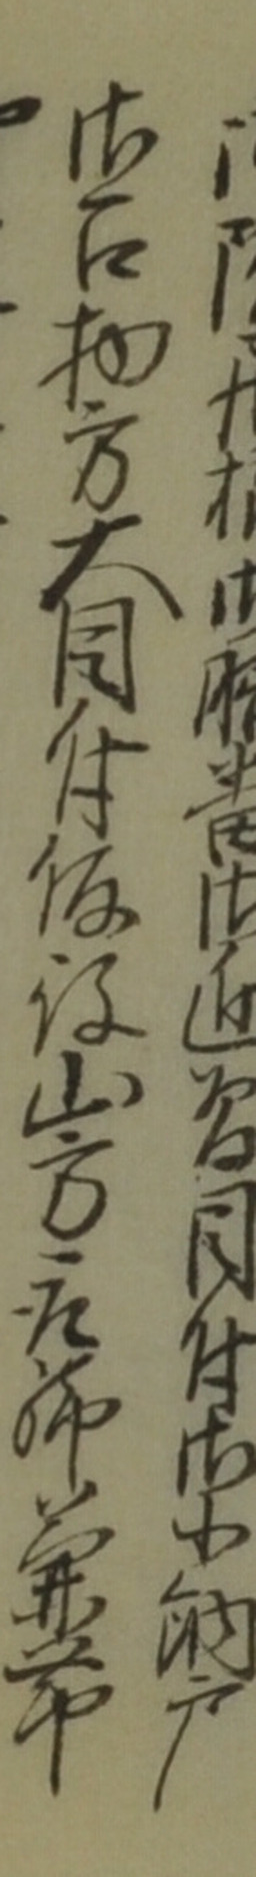御召物方大目付仮役山方取締兼帯
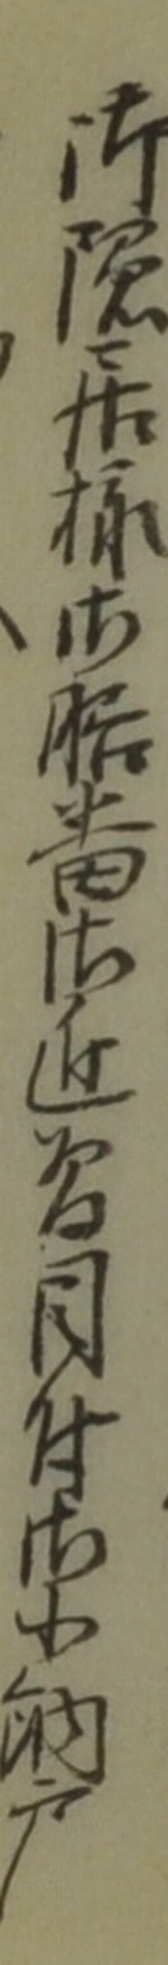御隠居様御膳番御近習目付御小納戸
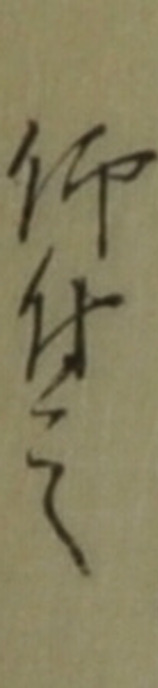仰付之
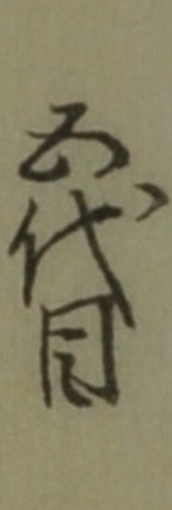五代目
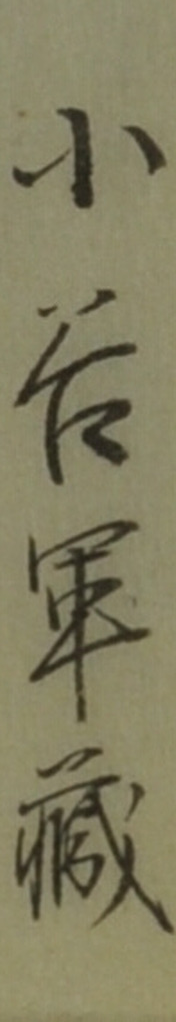小谷軍蔵
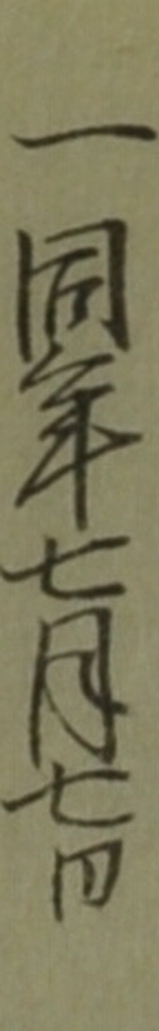一同年七月七日
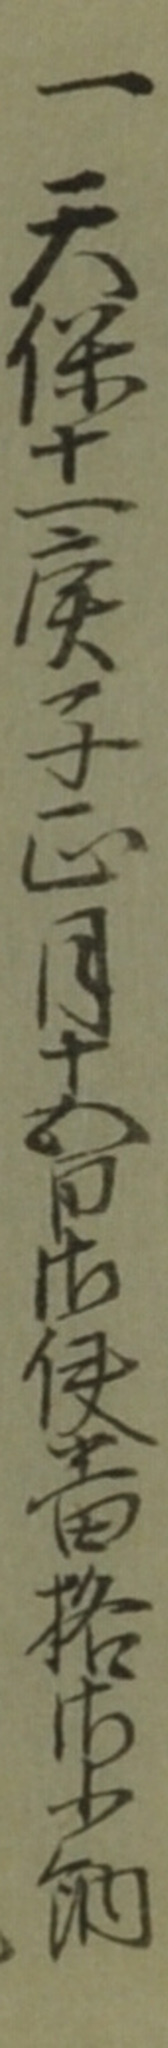一天保十一庚子正月十五日御使番格御小納
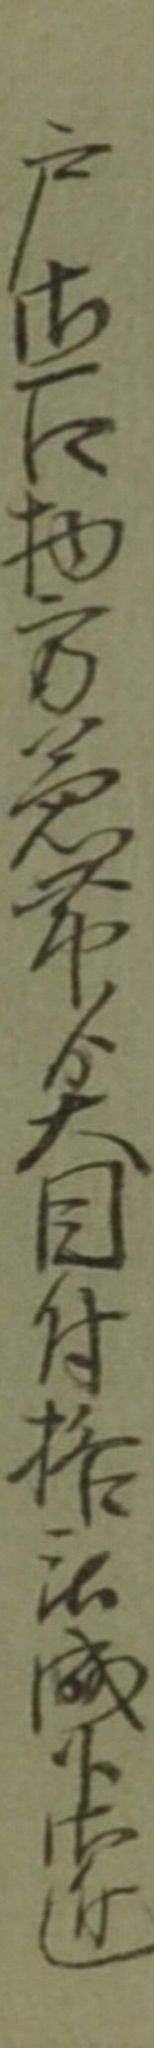戸御召物方兼帯ゟ大目付格被成下御近
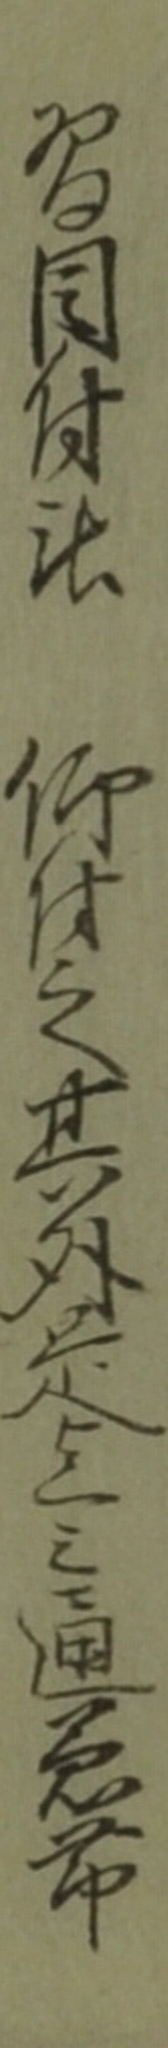習目付被仰付之其外是迄之通兼帯
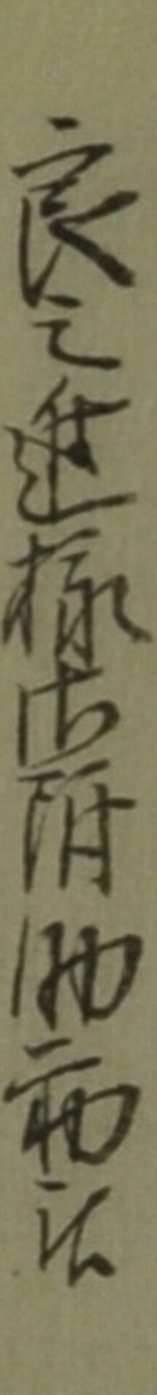良之進様御附助勤被
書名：諸御役代々録（四）
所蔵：伊那市立高遠町図書館・合同会社AMANE
